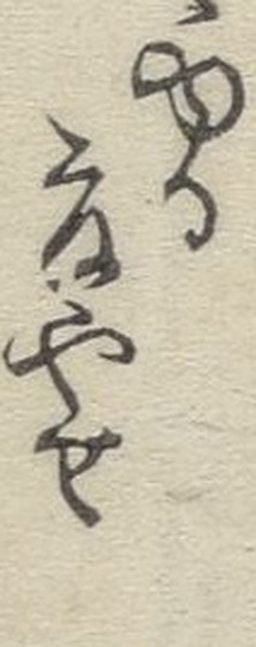夏やせ
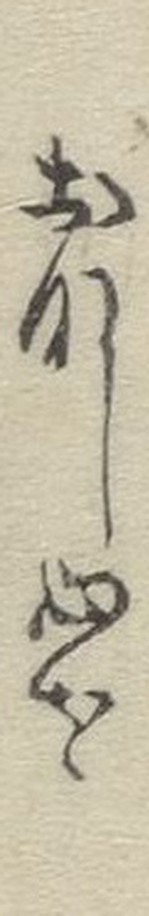おなし心を
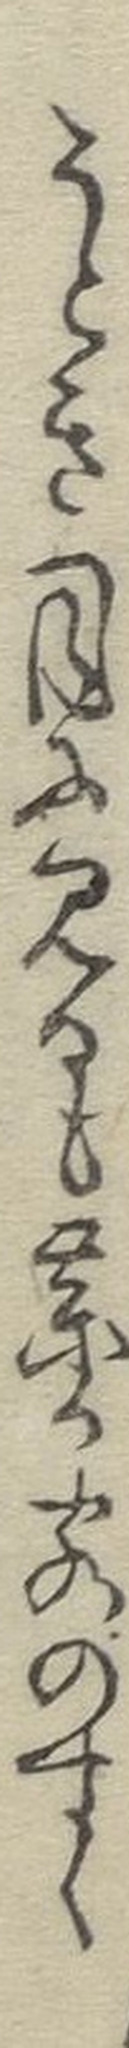うとき月に見るも薬か客のすく
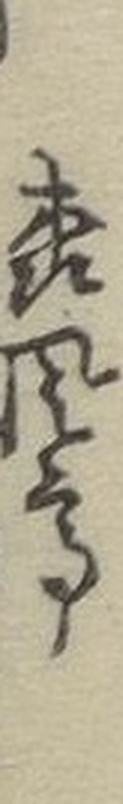和風亭
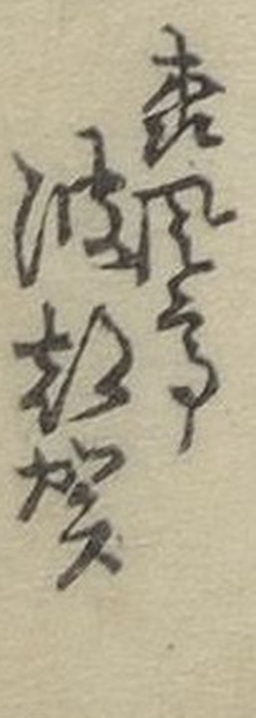波都賀

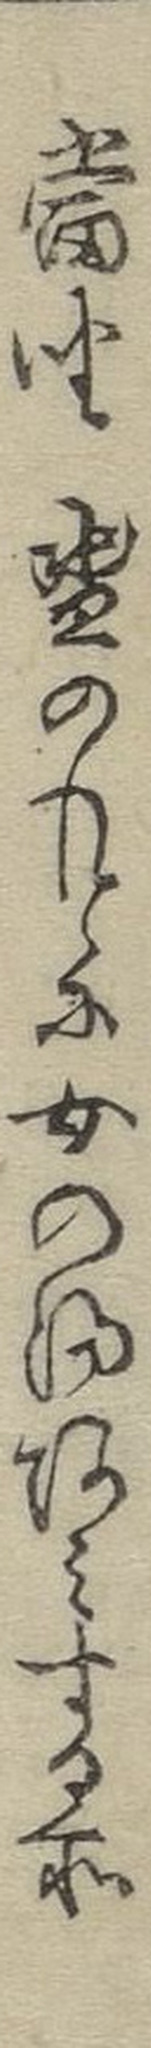当坐盥のもとに女の湯あみする所
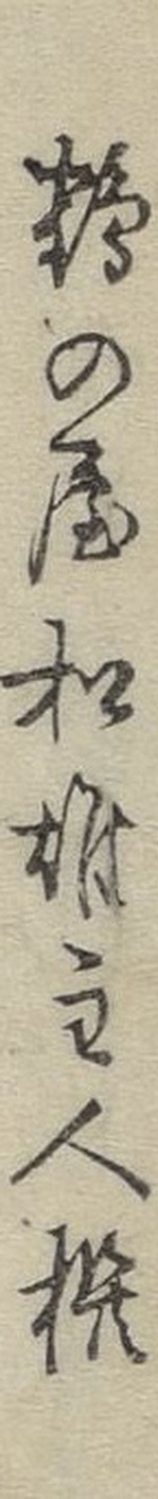鶴のや松雄主人撰
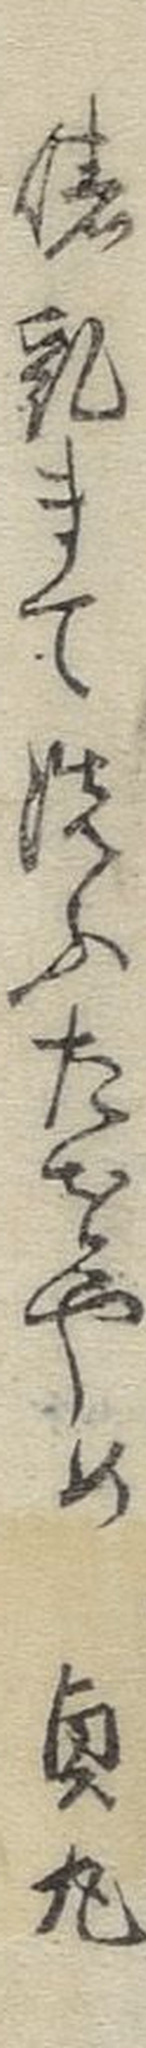俵乳まて洗ふたをやめ貞丸
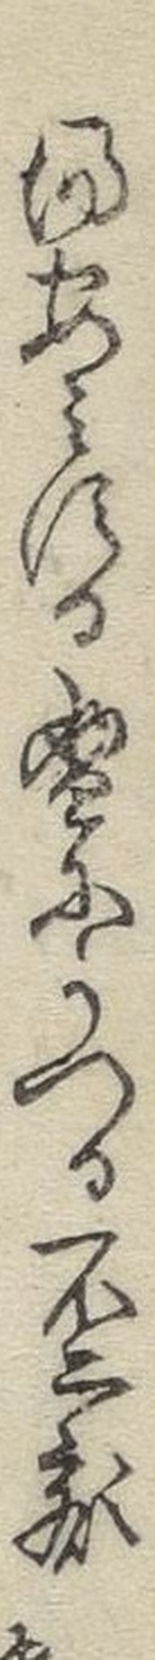湯あみする盥にうつる不二額蝶那言
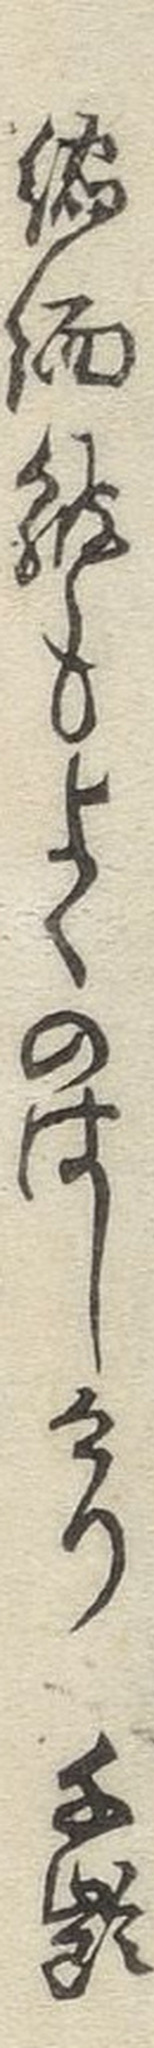縮緬皺もよくのはしけり千齢
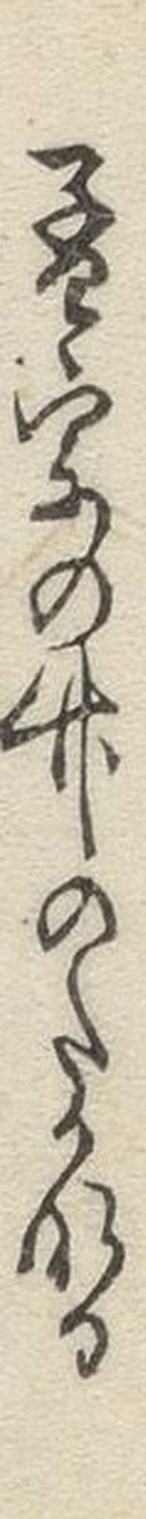孟宗の竹のたかなる
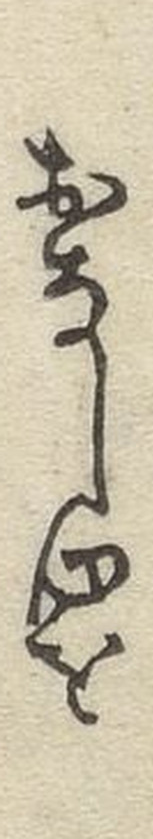おなし心を
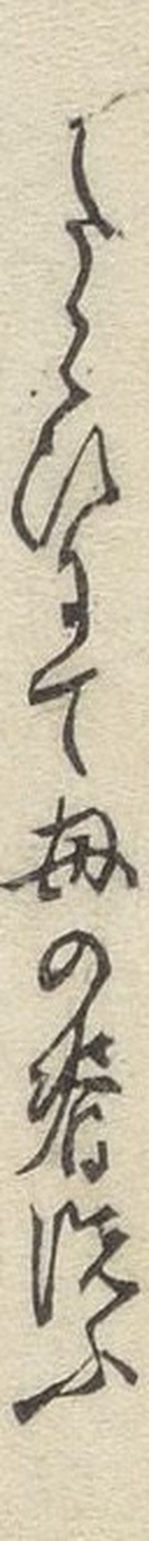たらひにて母の背洗ふ
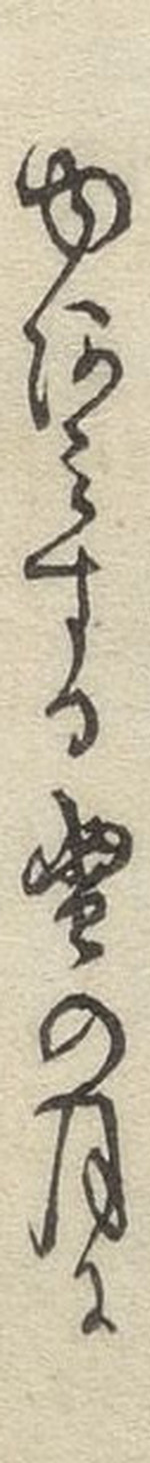ゆあみする盥の月に
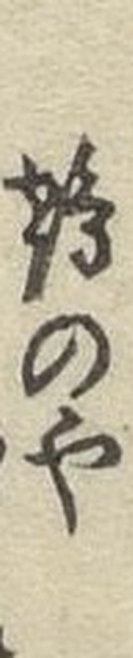学のや
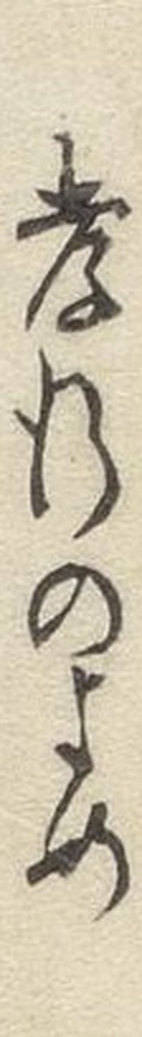孝行のよめ
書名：Picture Album of People with Kyōka (Light Verse) (Kyōka shiki jinbutsu 狂歌四季人物)
